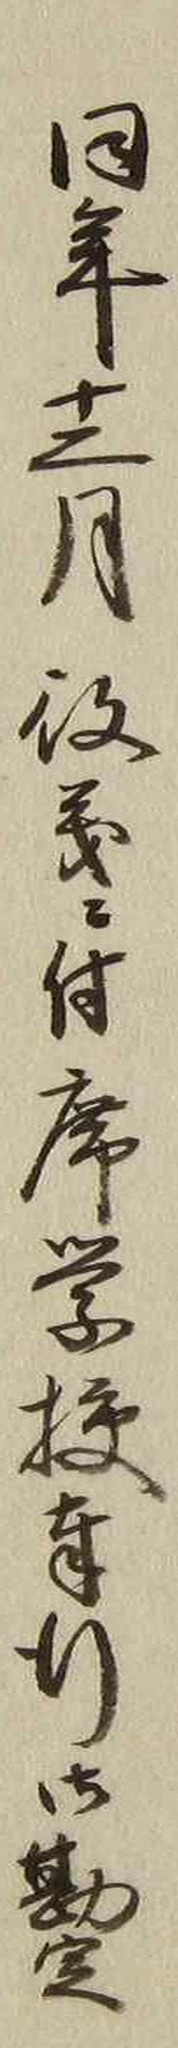一同年三月役義に付席学校奉行御勘定
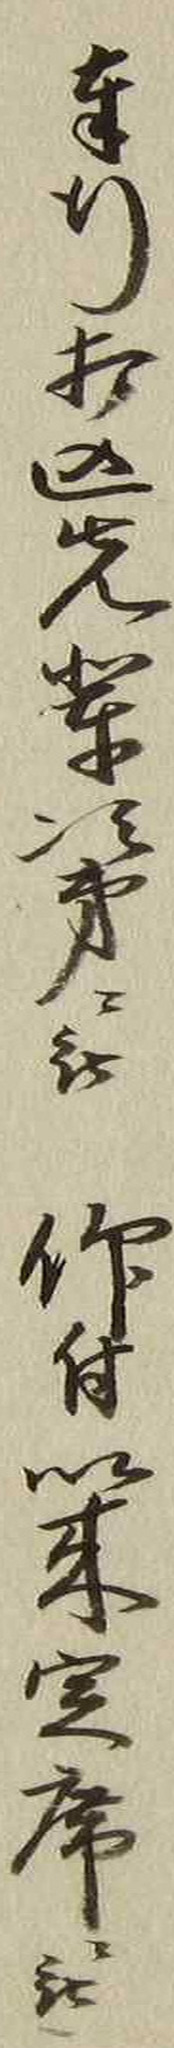奉行打込先輩次第に被仰付以来定席に被
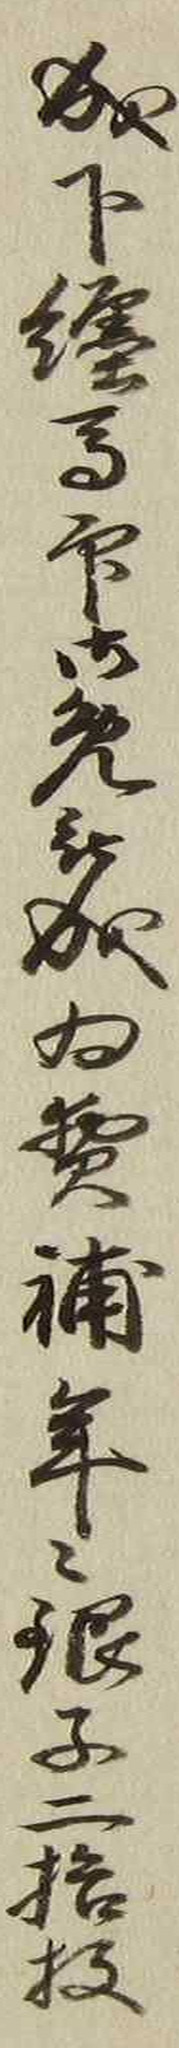成下纏馬印御免被成為費補年々銀子二拾枚
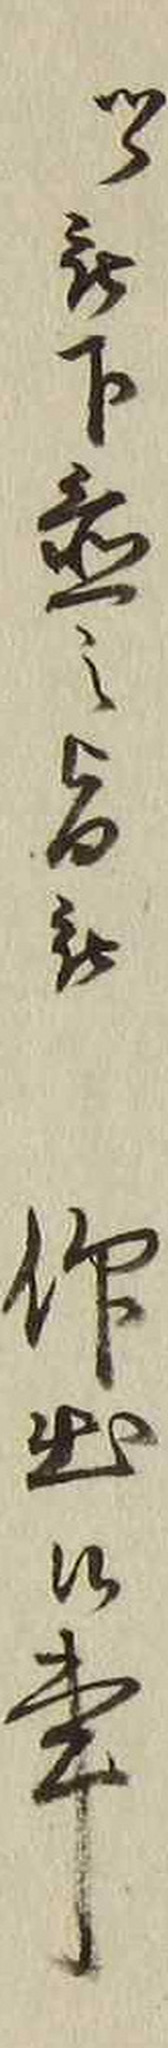つヽ被下置之旨被仰出候事
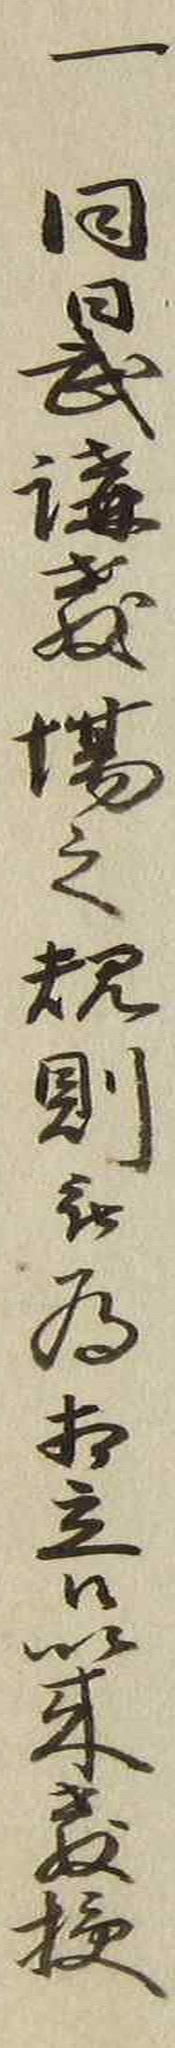一同日武講敷場之規則被為相立候以来教校
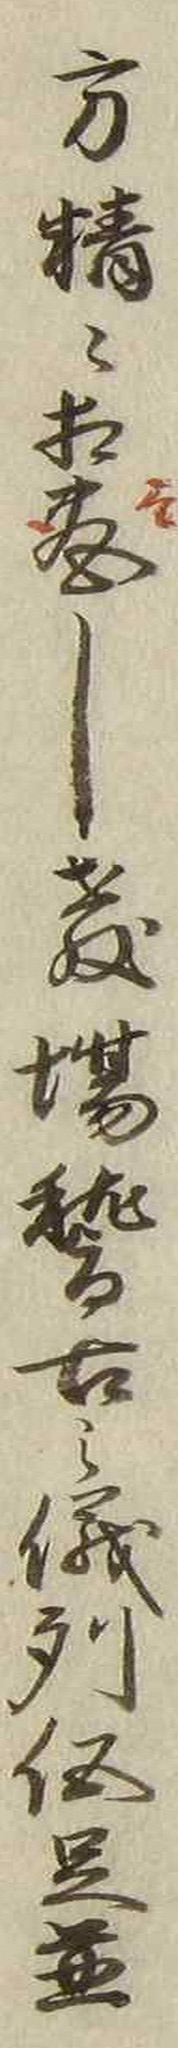方精々相尽し教場稽古之儀列伍足並
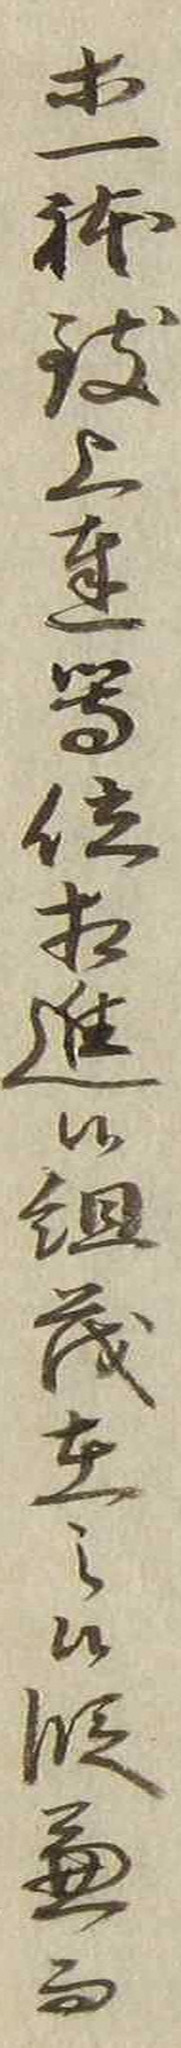等一体致上達等位相進候組も在之候段兼而

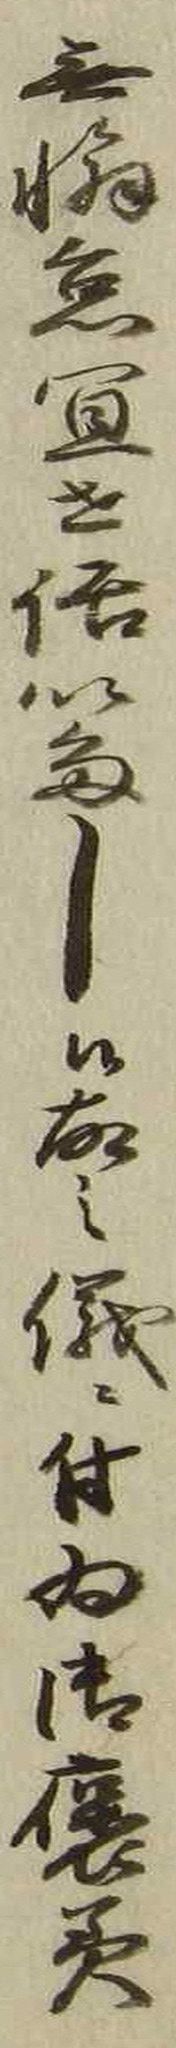無懈怠宜世話いたし候故之儀に付為御褒美
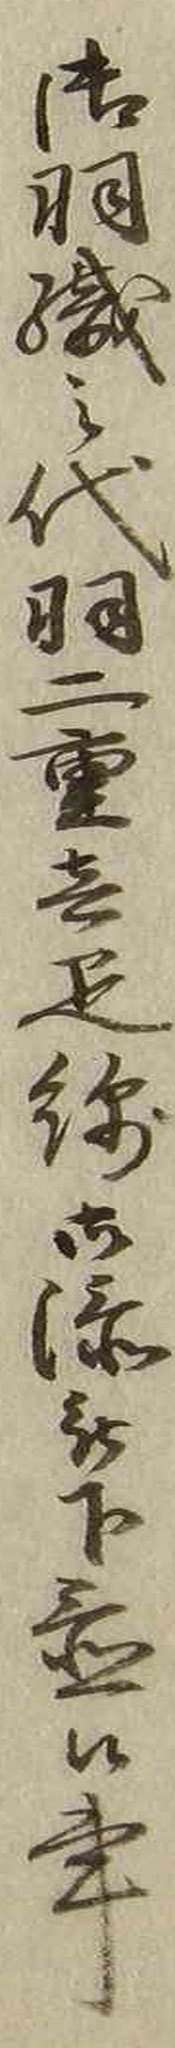御羽織之代羽二重壱疋綿御添被下置候事
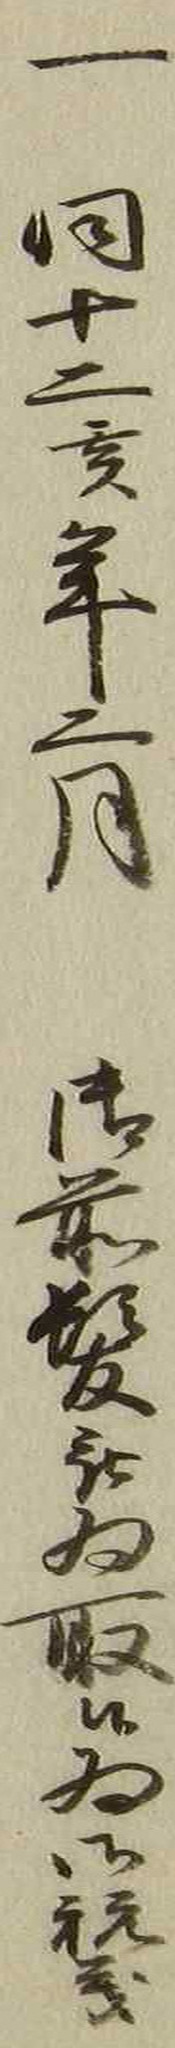一同十二亥年二月御前髪被為取候為御祝義
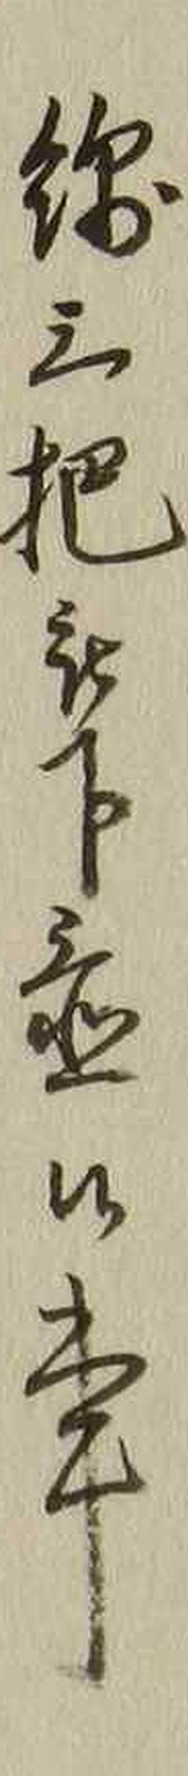綿三把被下置候事
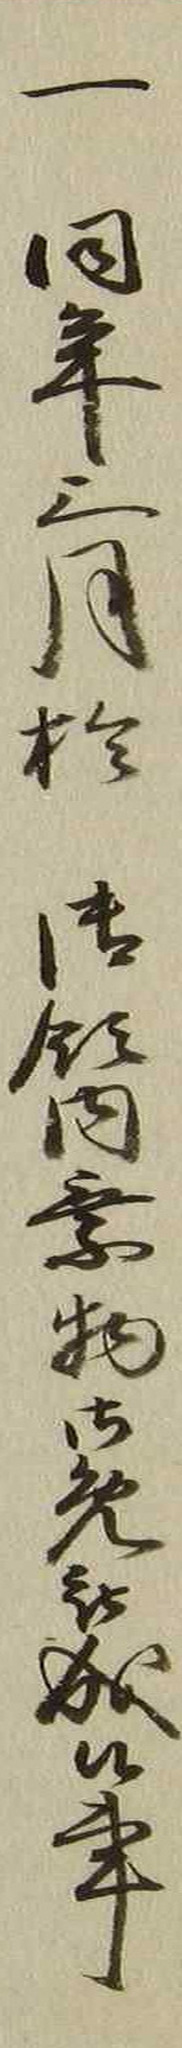一同年三月於御領内乗物御免被成候事
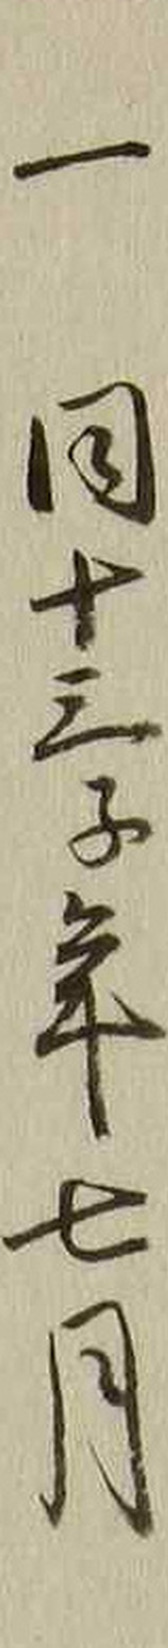一同十三子年七月
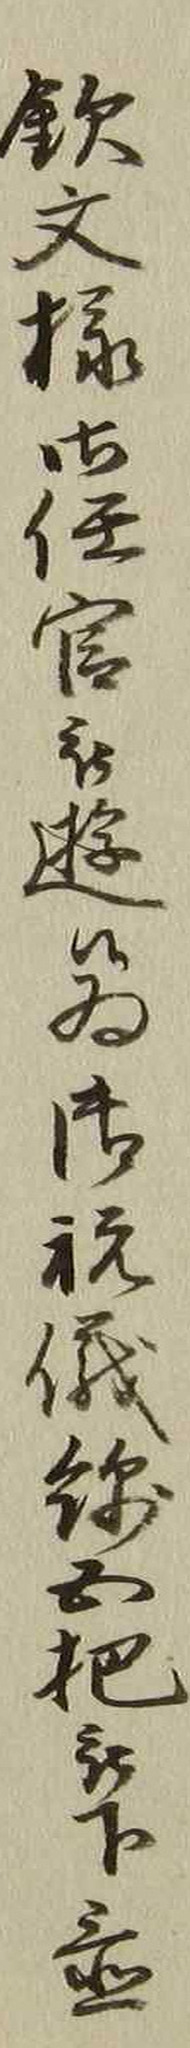欽文様御任官被遊候為御祝儀綿五把被下置
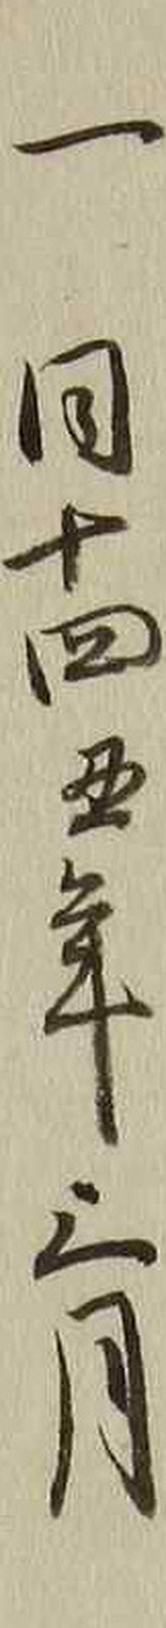一同十四丑年三月
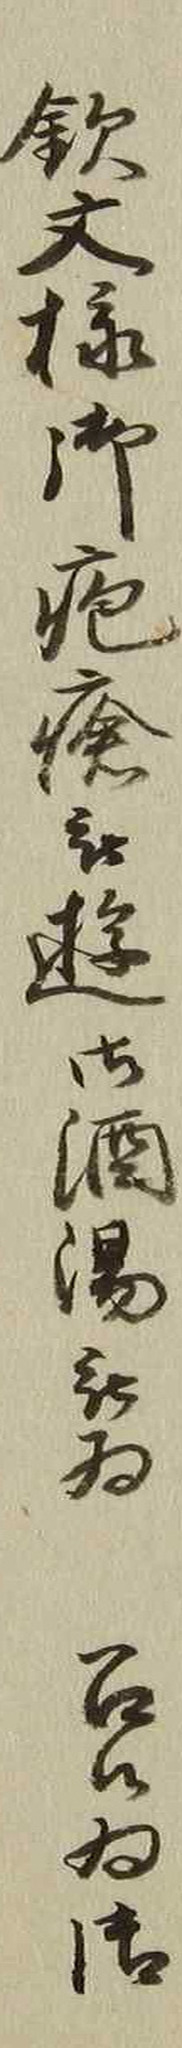欽文様御疱瘡被遊御酒湯被為召候為御
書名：諸士系譜　巻之133　た之部9
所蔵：会津若松市立会津図書館
